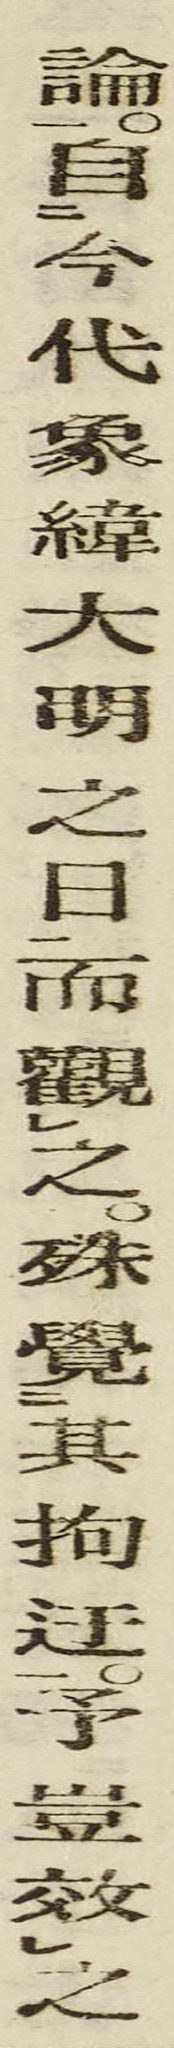論。自今代象緯大明之日而観之。殊覚其拘迂。予豈效之
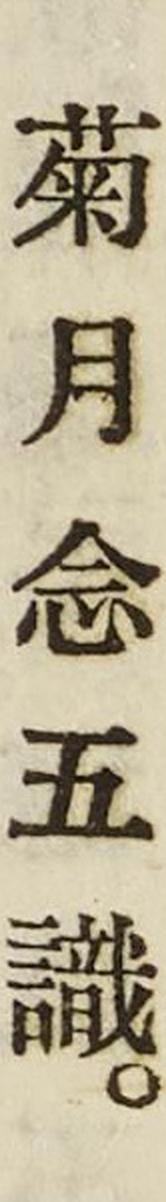菊月念五識。
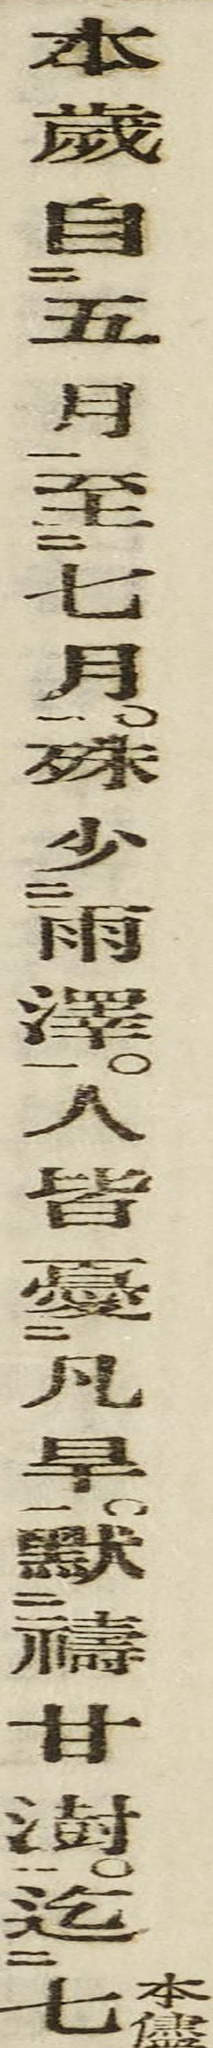本歳自五月至七月。殊少雨沢。人皆憂凡旱。默祷甘澍。迄七本儘
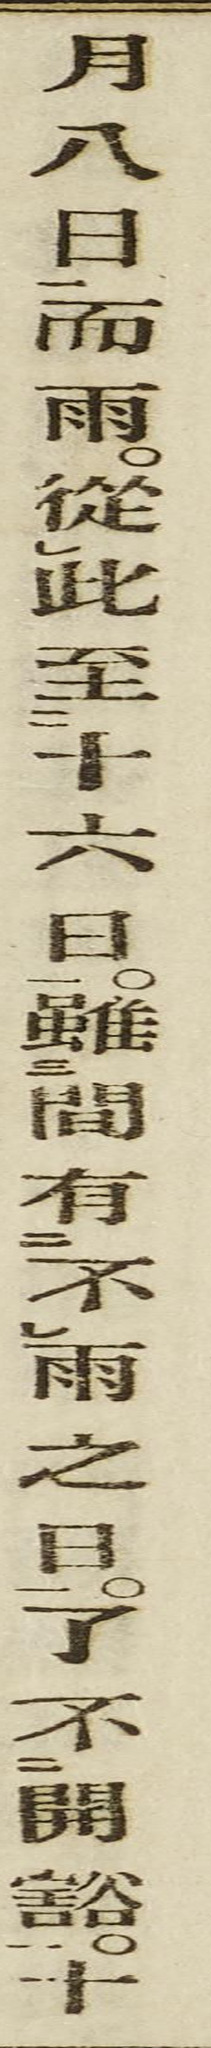月八日而雨。従此至十六日。雖間有不雨之日。了不開豁。十

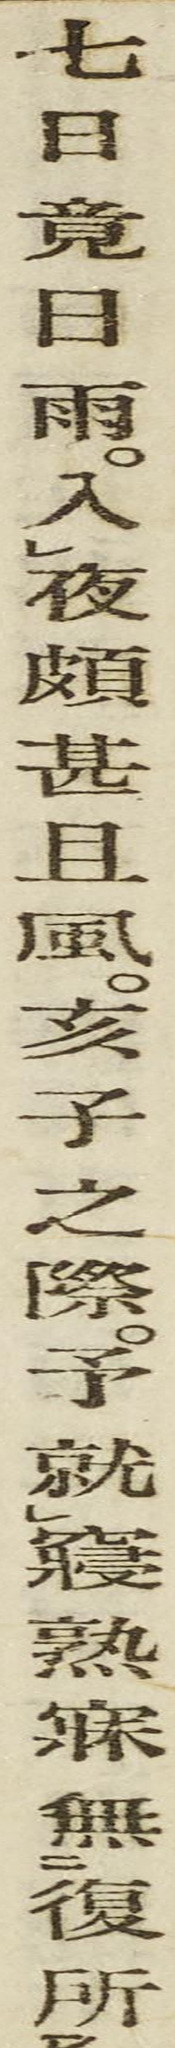七日竟日雨。入夜頗甚且風。亥子之際。予就𥨊熟寐無復所レ
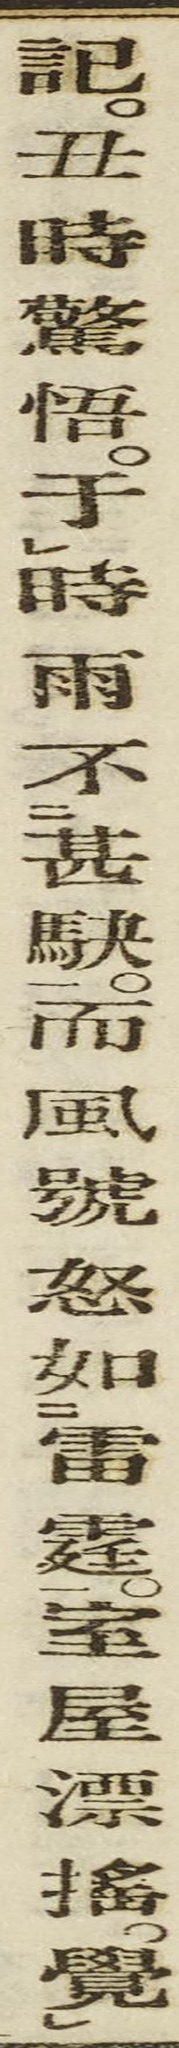記。丑時驚悟。于時雨不甚駃。而風号怒如ニ雷霆。室屋漂揺。覚
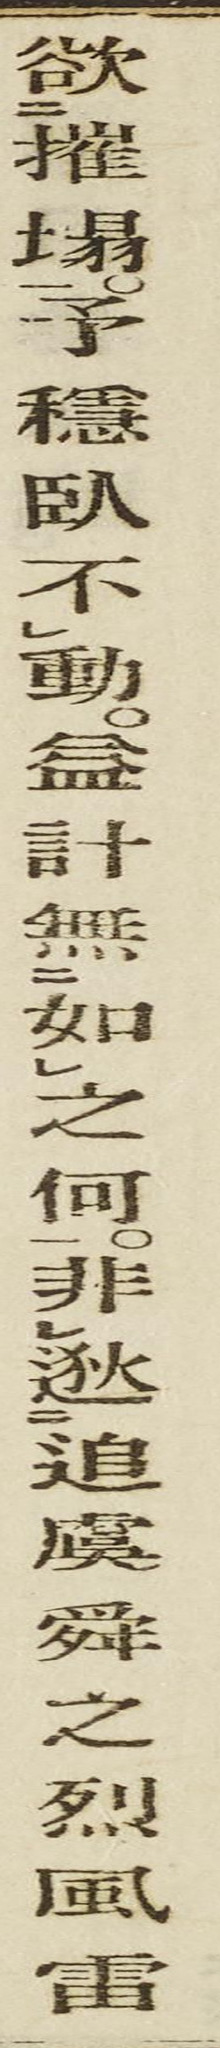欲ニ摧搨。予穏臥不動。益計無ニ如之何。非逖ニ追虞舜之烈風雷
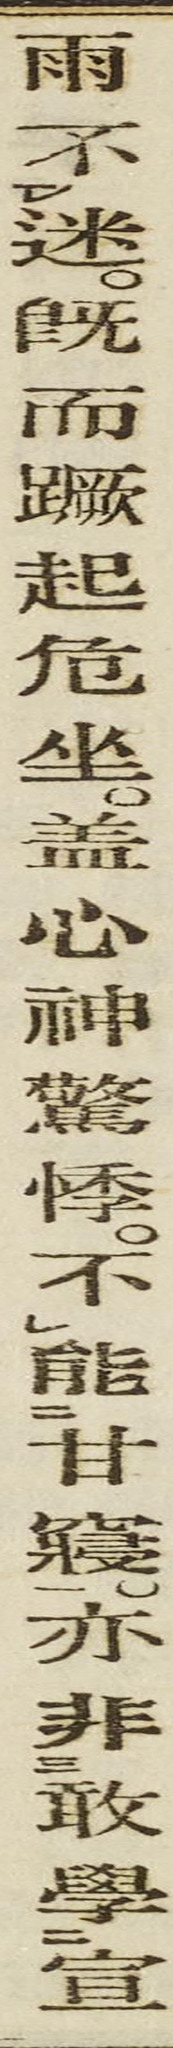雨不レ迷。既而蹶起危坐。盖心神驚悸。不能ニ甘寝。亦非敢学ニ宣
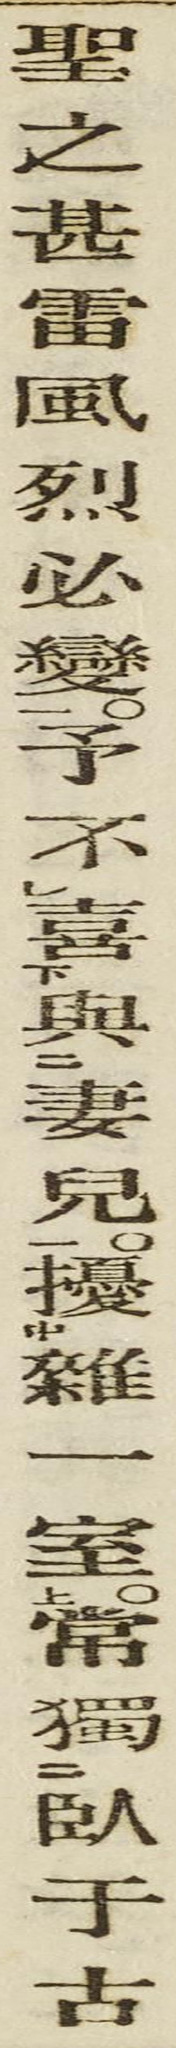聖之甚雷雨烈必変。予不喜与ニ妻児。擾雑一室。常独ニ臥于古
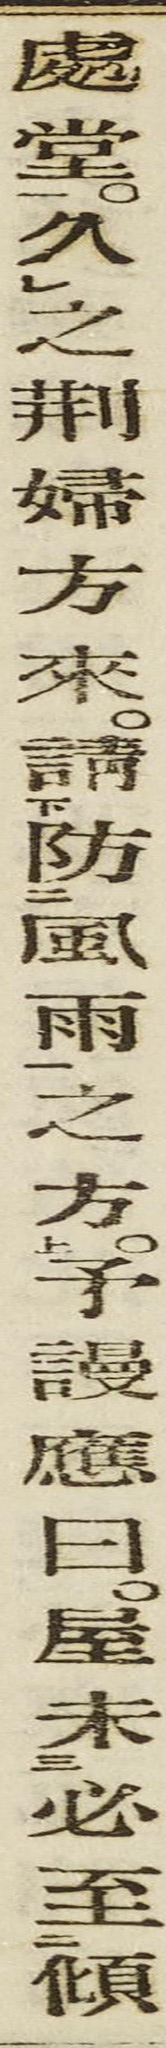処堂。久之荊婦方来。請防ニ風雨之方。予謾応曰。屋未必至ニ傾
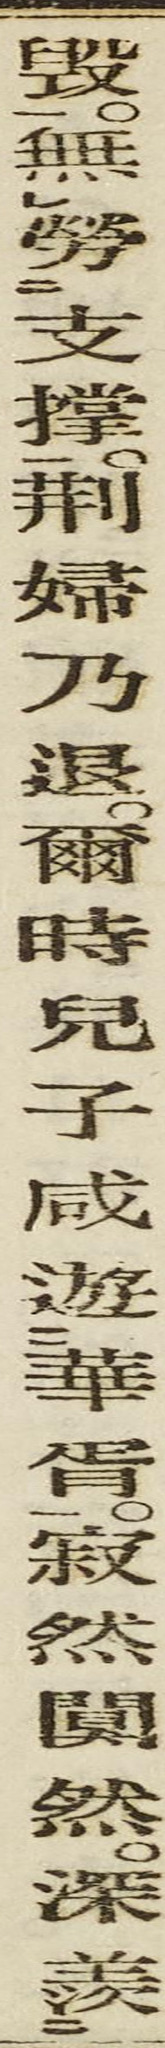毀。無労ニ支撑。荊婦之退。爾時児子咸遊ニ華胥。寂然闃然。深羡ニ
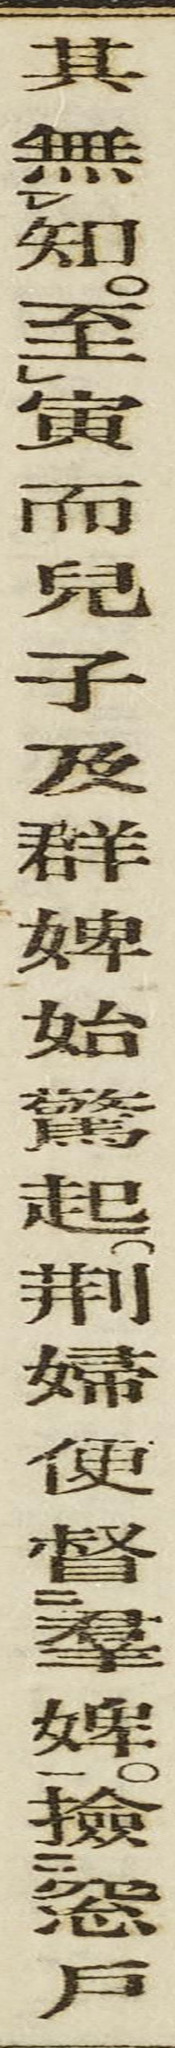其無レ知。至寅而児子及群婢始驚起。荊婦便督ニ羣婢。撿ニ窓戸
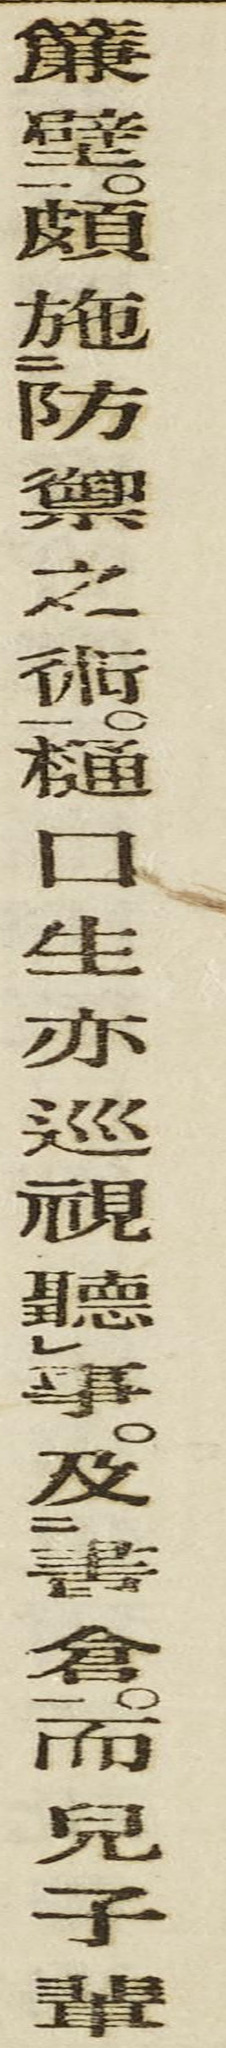簾壁。頗施ニ防禦之術。樋口生亦巡視聴事。及ニ書倉。而児子輩
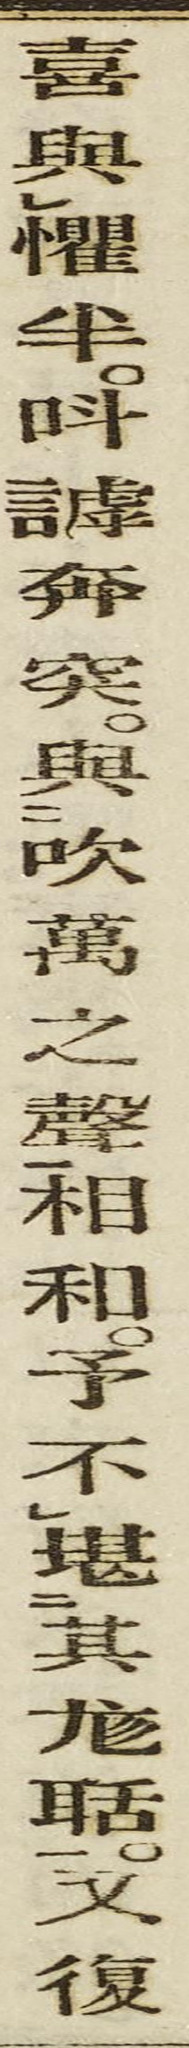喜与懼半。叫謼奔突。与ニ吹万之声相和。予不堪ニ其尨聒。又復
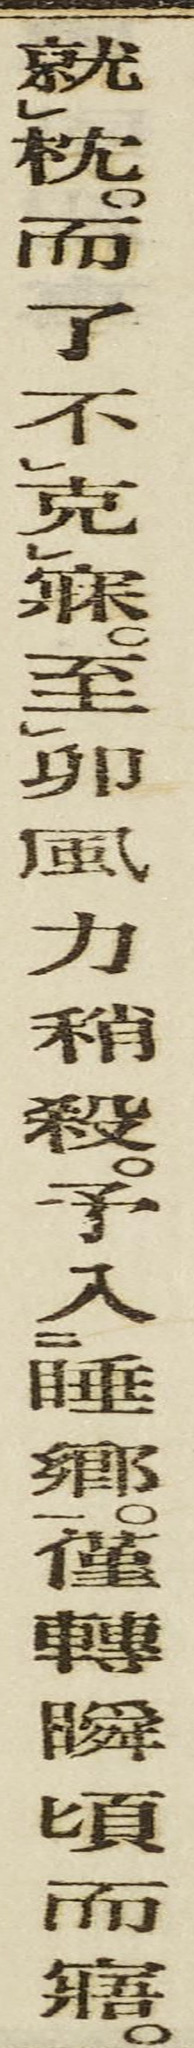就枕。而了不克寐。至卯風力稍殺。予入ニ睡郷。僅転瞬頃而寤。
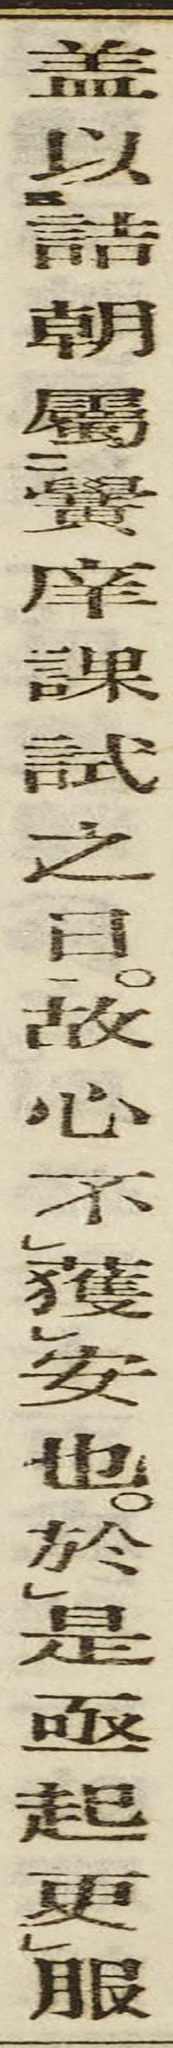盖以詰朝属ニ黌庠課試之日。故心不獲安也。於是亟起更服
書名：史籍集覽　朝鮮陣古文・細井廣澤記・颶風紀事・天明七年將軍宣下次第書　全
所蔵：東京大学地震研究所図書室 Earthquake Research Institute Library, The University of Tokyo, JAPAN
